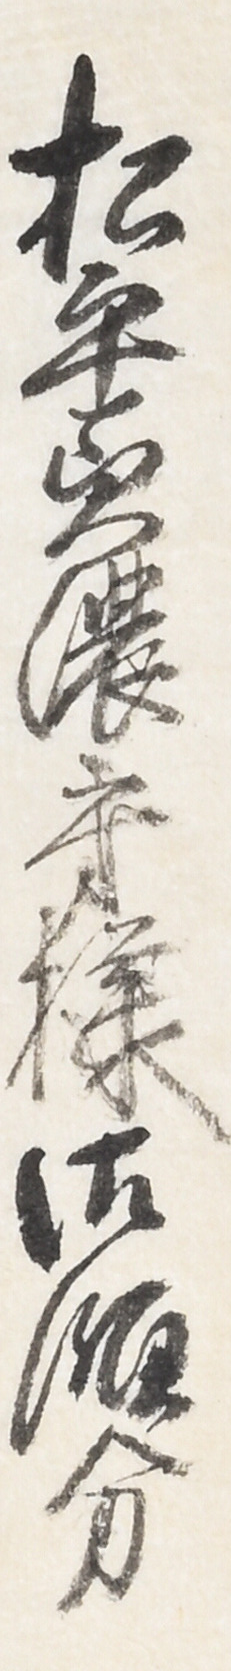松平美濃守様御領分
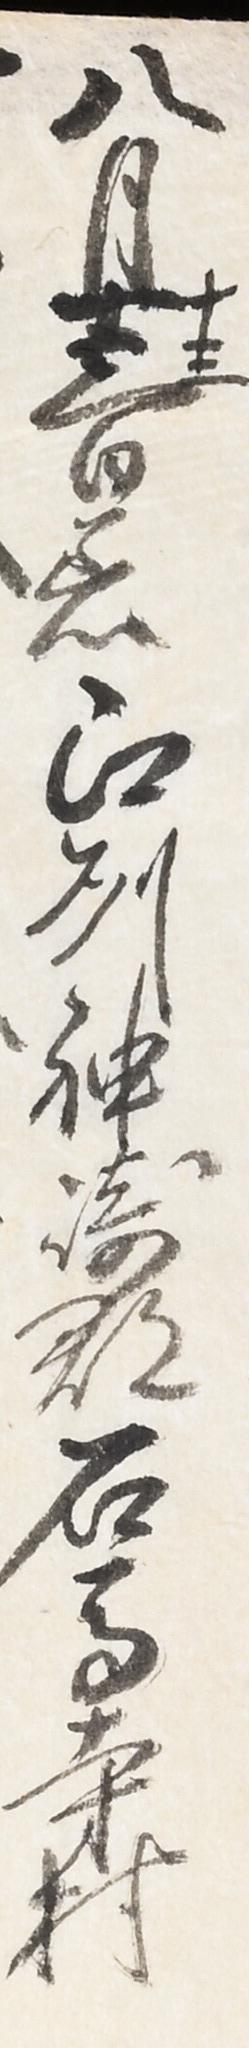八月七日着江州神崎郡稲葉村
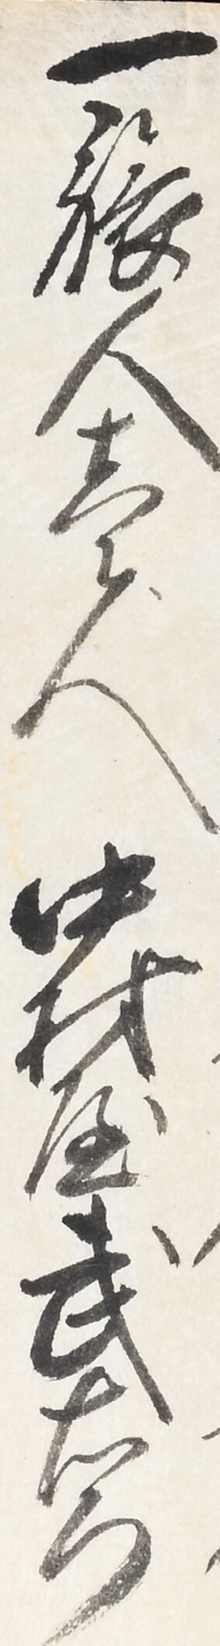一旅人壱人中村屋武右衛門
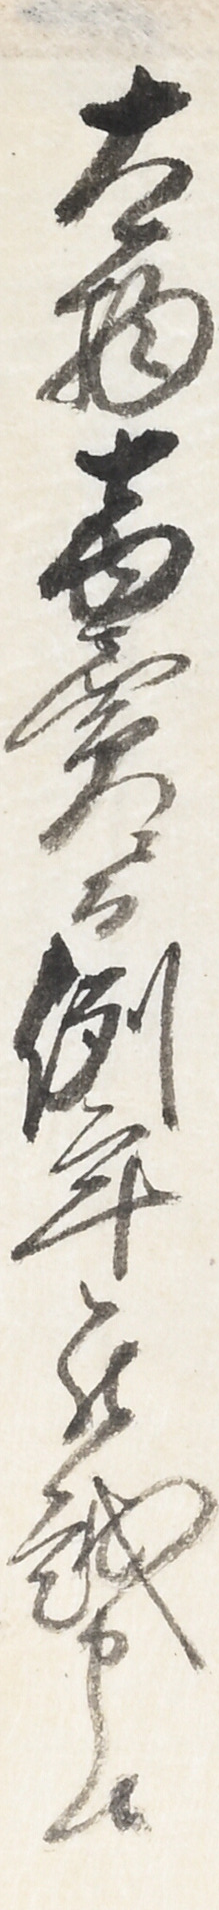太物商売ニ而例年罷越申候
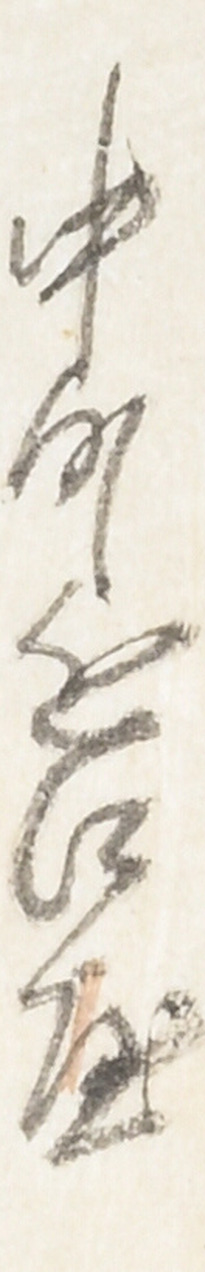中町近江屋
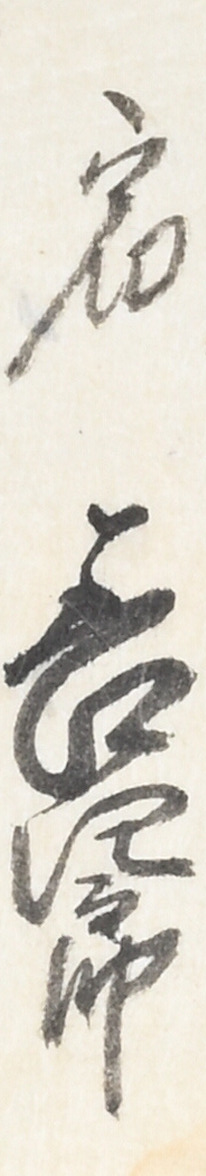宿善四郎
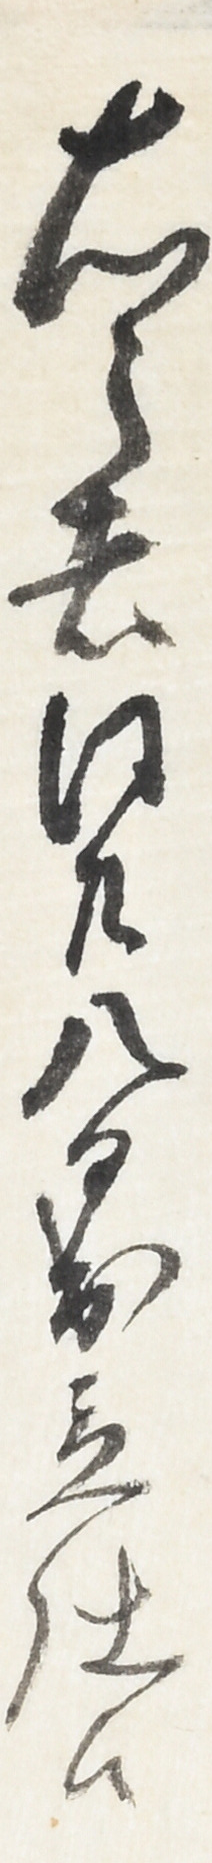右之者同廿八日出立仕候
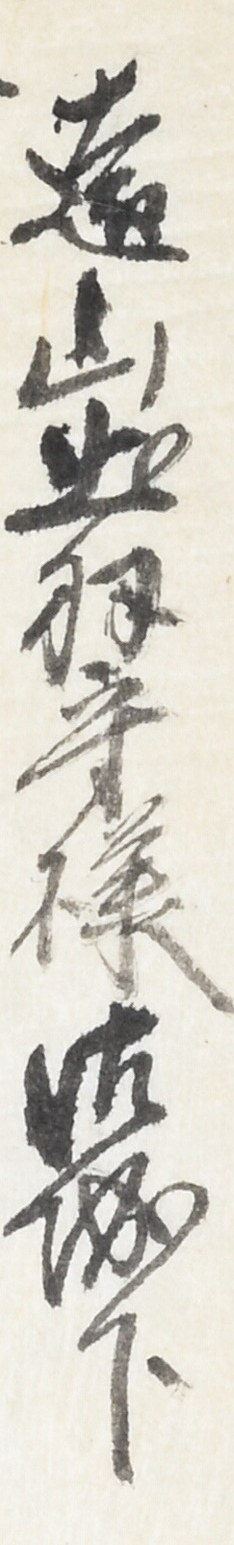遠山出羽守様御城下
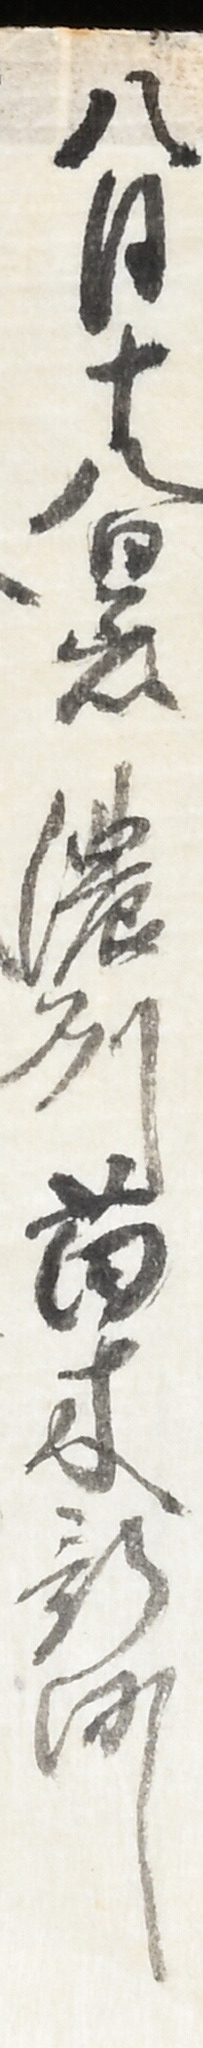八月十八日着濃州苗木新町
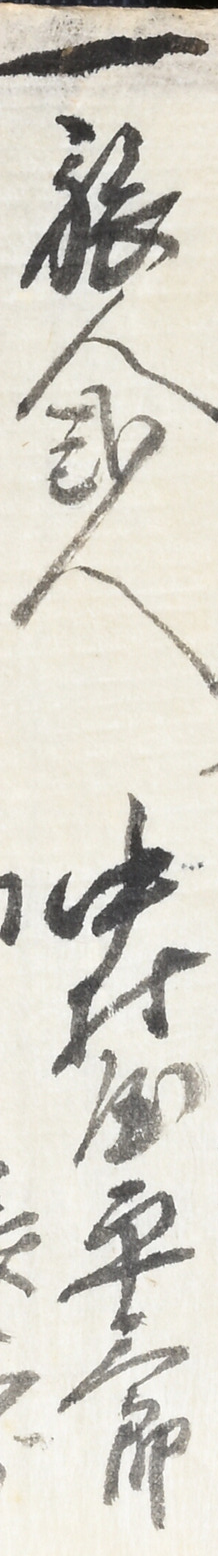一旅人弐人中村屋平三郎
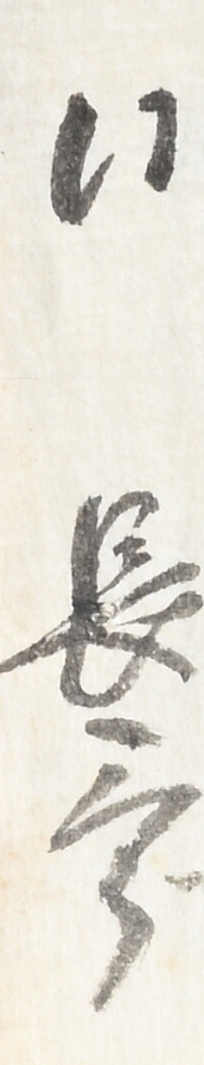同長三郎

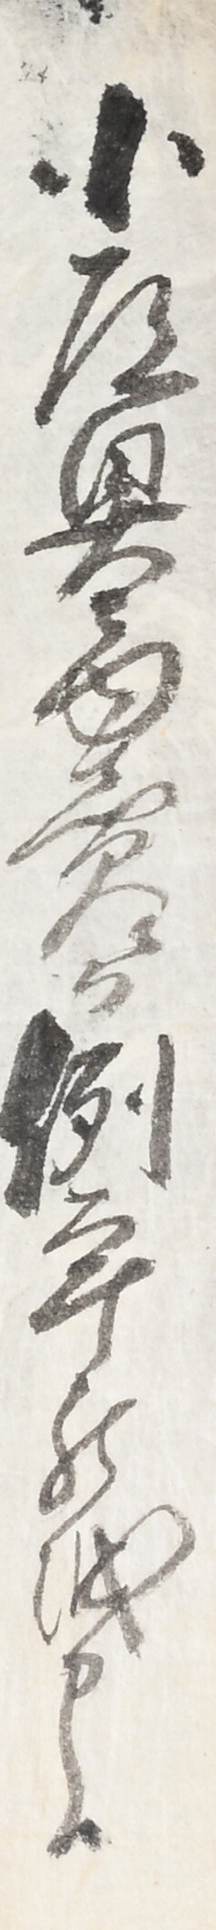小道具商売ニ而例年罷越申候
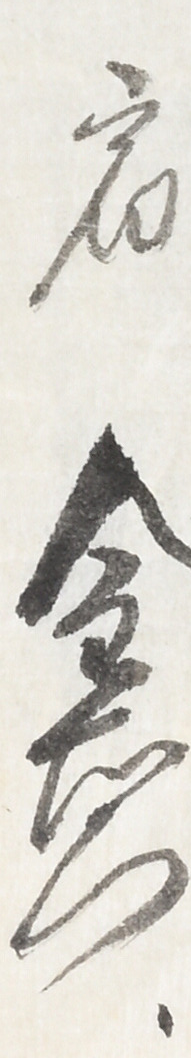宿金右衛門
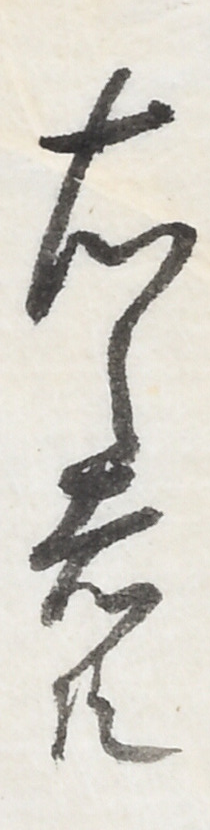右之者共
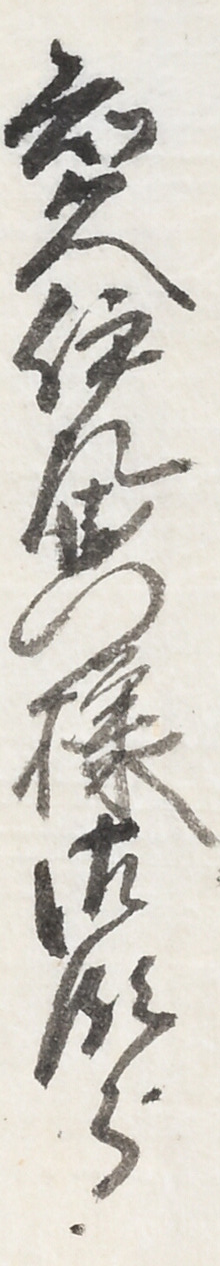知久伊左衛門様御領分
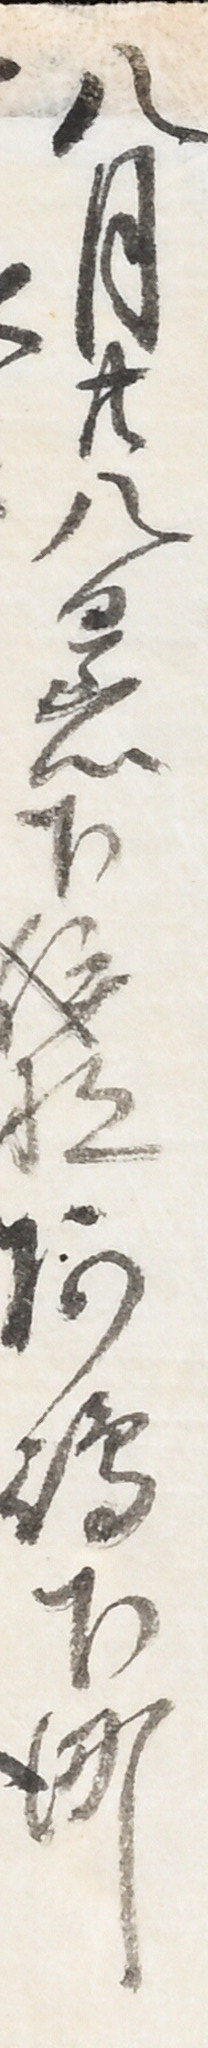八月廿八日着下伊那阿嶋下町
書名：旅人泊控帳
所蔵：伊那市立高遠町図書館・合同会社AMANE
